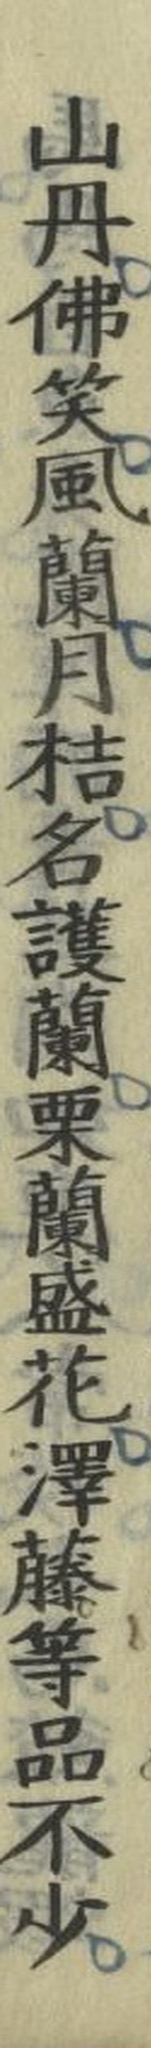山丹。佛笑。風蘭。月桔。名護蘭。栗蘭盛花。澤藤等品不少。
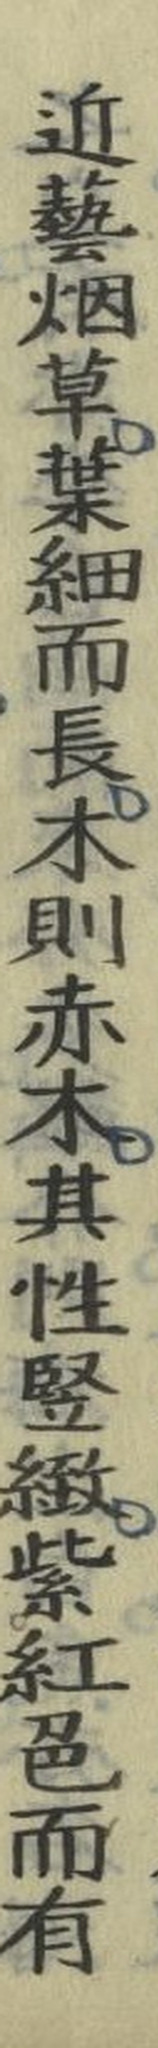近藝烟草。葉細而長。木則赤木。其性竪緻。紫紅色而有
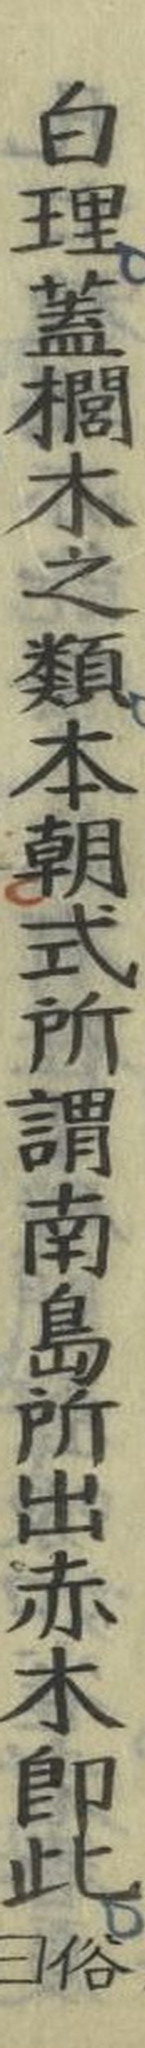白理。蓋櫚木之類。本朝式所謂南島所出赤木卽此。俗曰
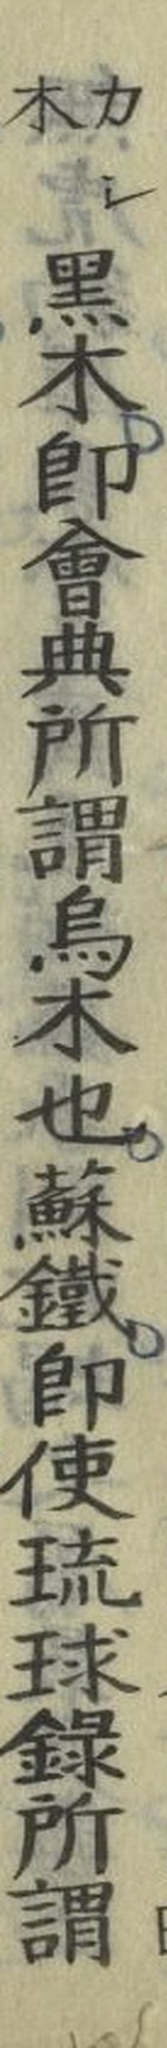カシ木黑木。卽會典所謂烏木也。蘇鐵。卽使琉球錄所謂

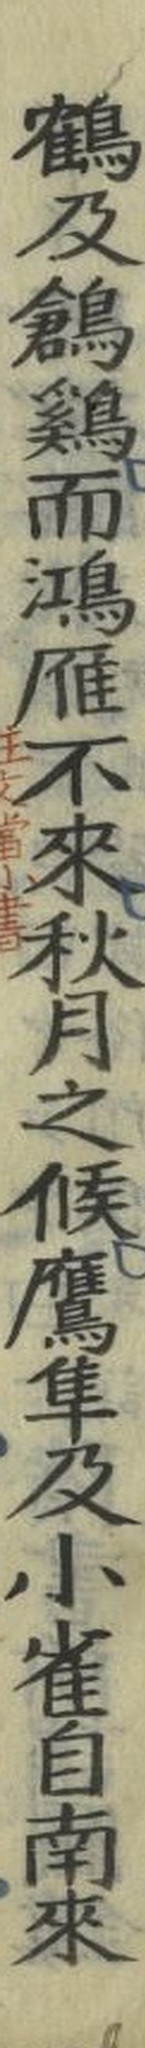鶴及鶬鷄。而鴻雁不來。秋月之候。鷹隼及小雀自南
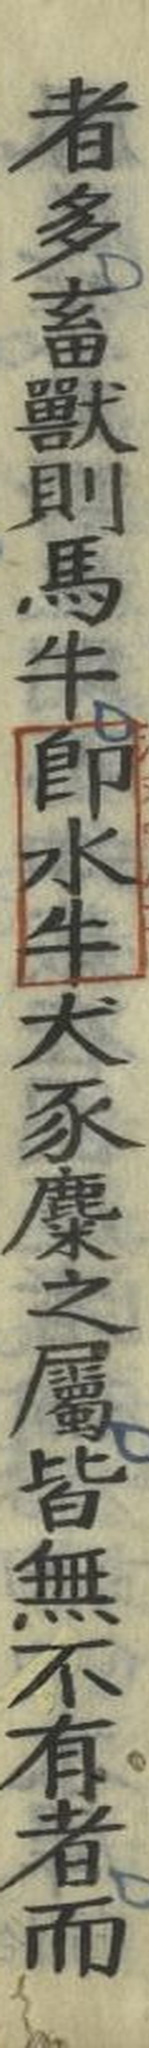者多。畜獸則馬牛卽水牛犬豕麋之屬。皆無不有者。而
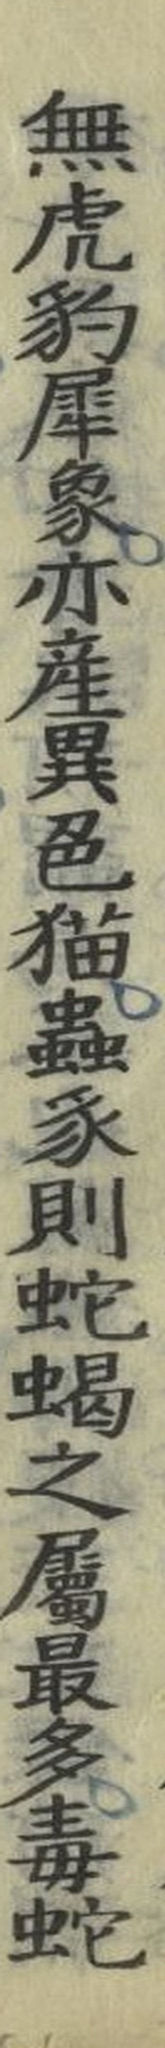無虎豹犀象。亦産異色猫。蟲豸則蛇蝎之屬最多。毒
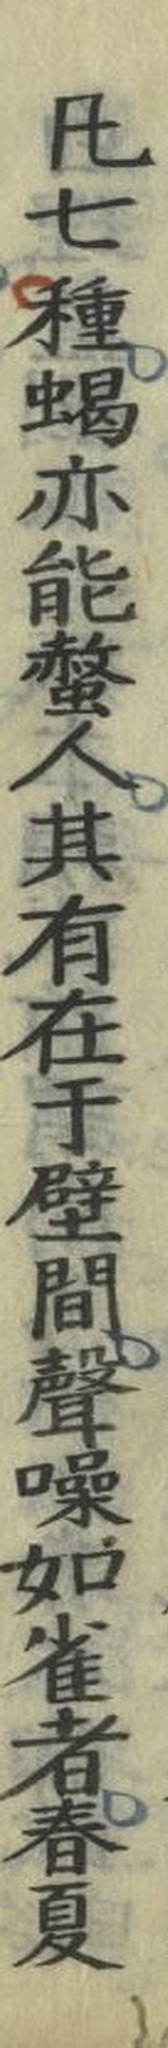凡七種。蝎亦能螫人。其有在于壁間。聲噪如雀者。春夏
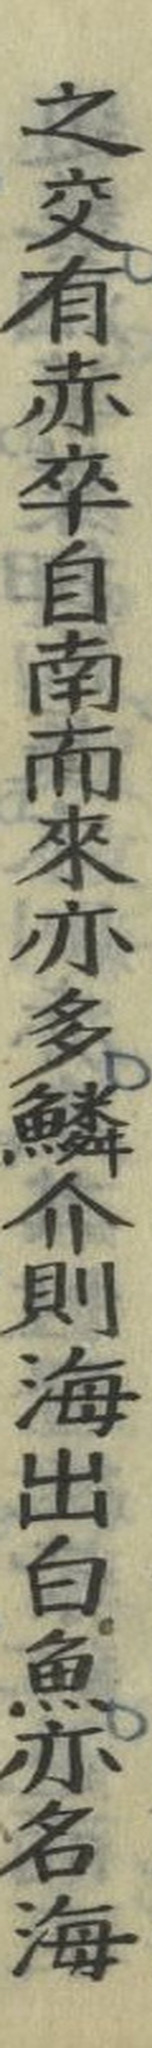之交。有赤卒自南而來亦多。鱗介則海出白魚。亦名海
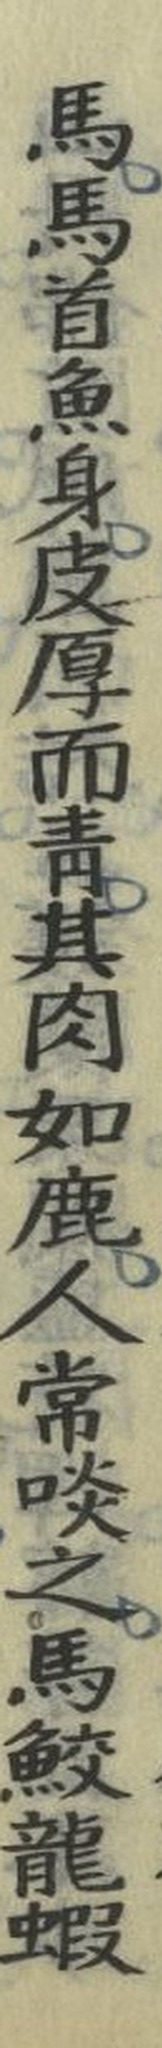馬。馬首魚身。皮厚而靑。其肉如鹿。人常啖之。馬鮫龍蝦
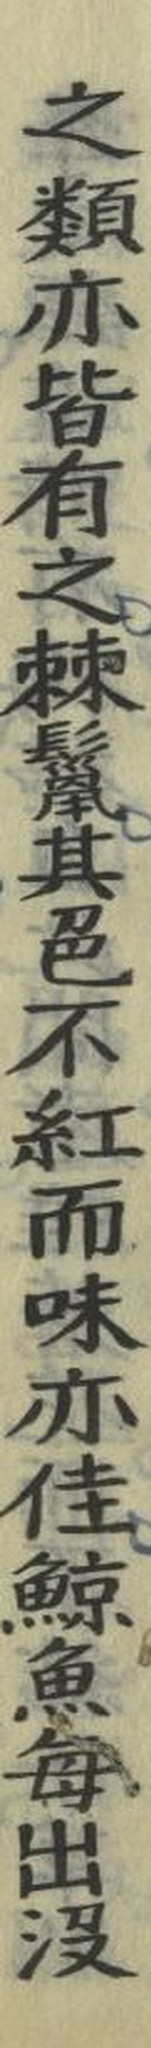之類亦皆有之。棘鬣。其色不紅而味亦佳。鯨魚每出沒
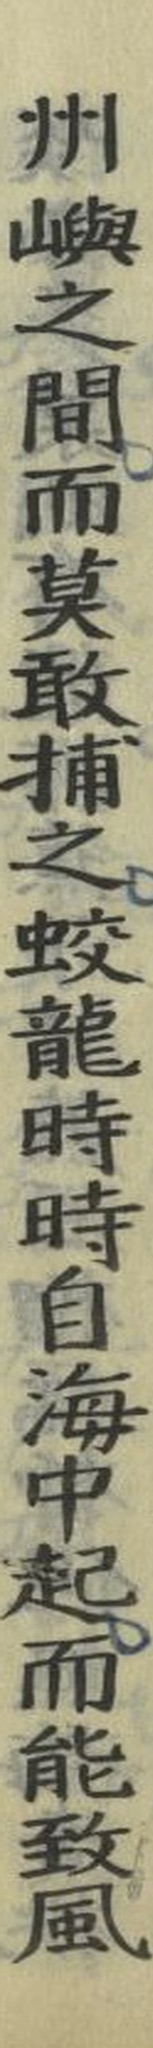州嶼之間。而莫敢捕之。蛟龍時時自海中起。而能致
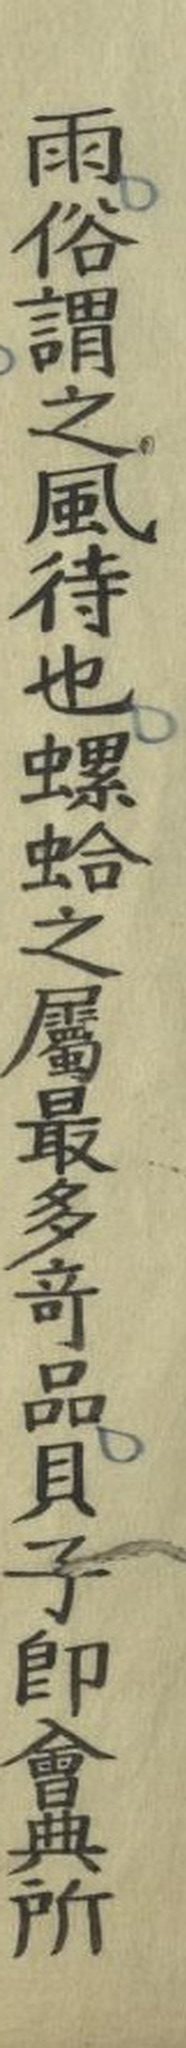雨。俗謂之風待也。螺蛤之屬最多竒品。貝子卽會典所
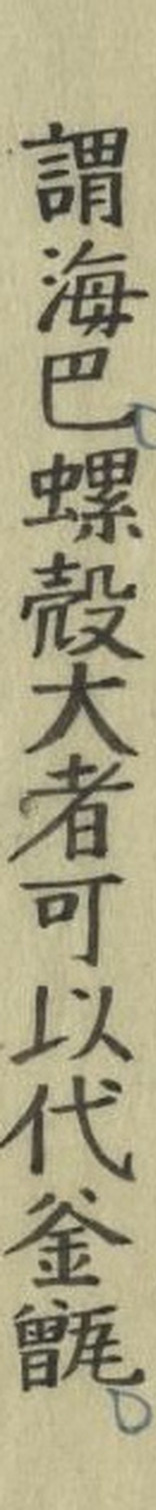謂海巴。螺殻大者可以代釜甑。
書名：南島志
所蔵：University of the Ryukyus Library
